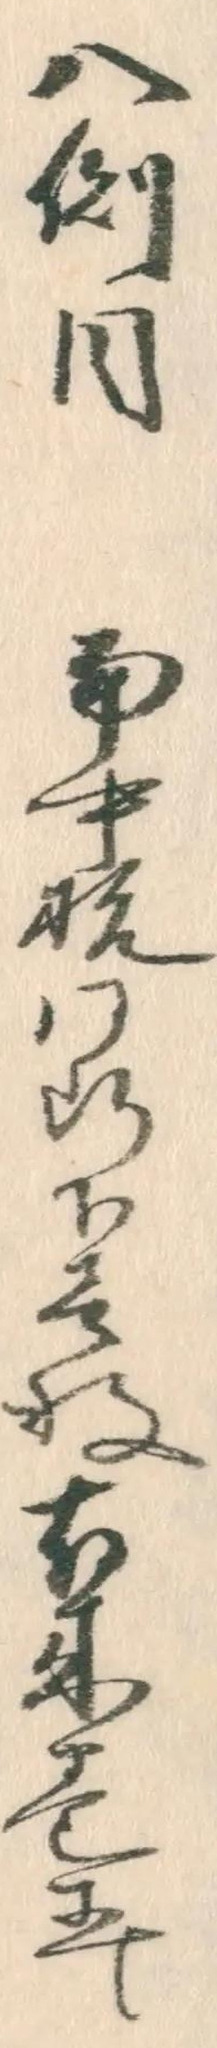八側目南中杭同断下壱枚有来巻直し
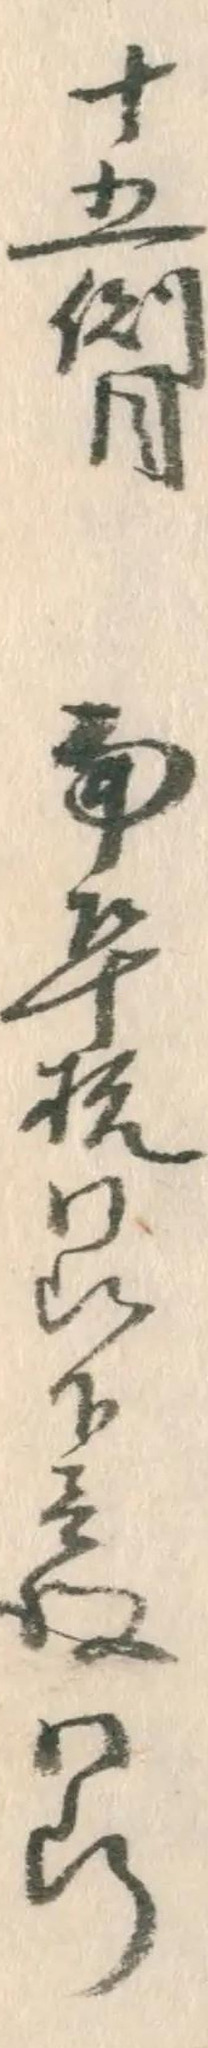十五側目南耳杭同断下壱枚同断
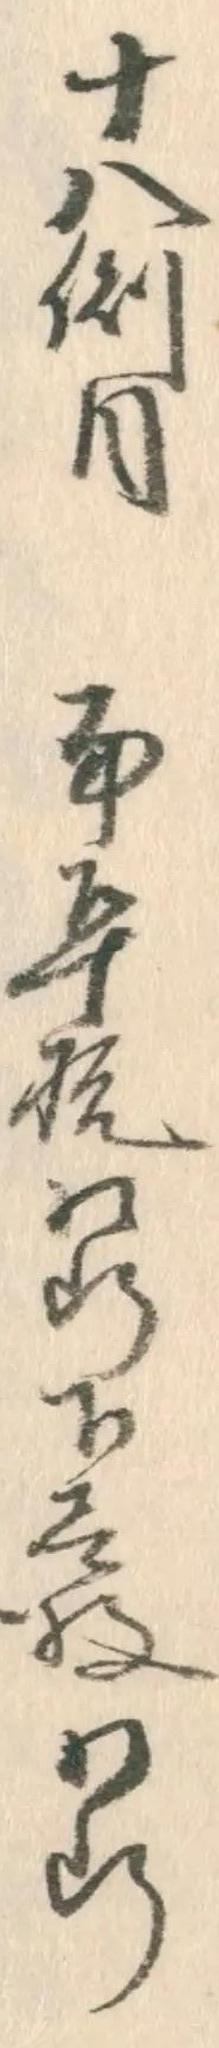十八側目南耳杭同断下壱枚同断

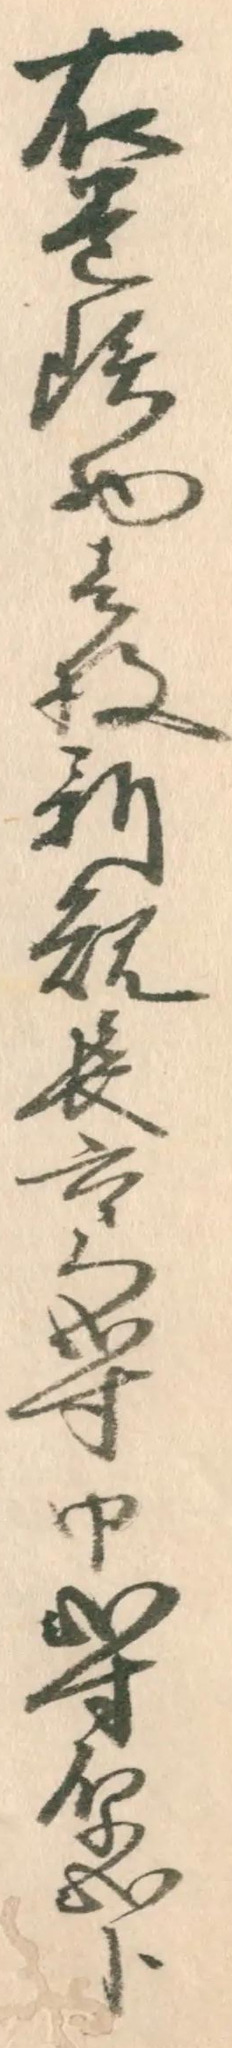右巻鉄物壱枚新規長六尺弐寸巾弐寸厚弐分
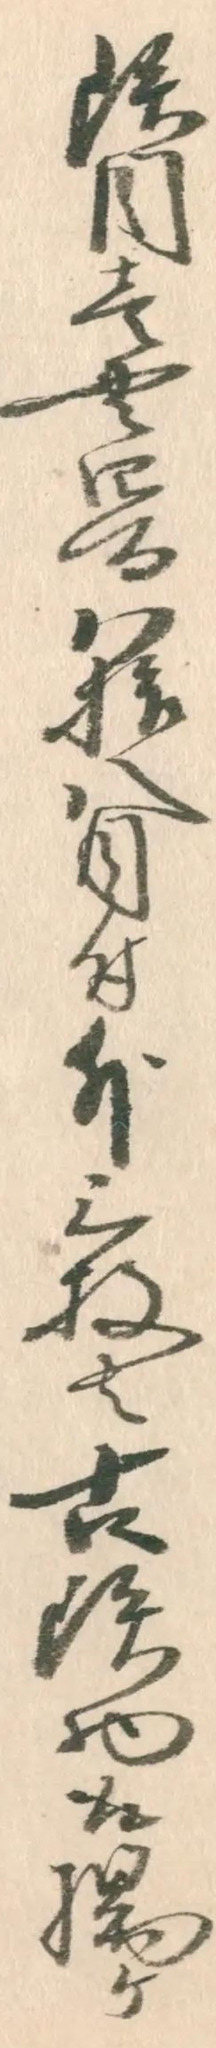鉄目壱貫四百八拾八目付外三枚は古鉄物取揚ケ
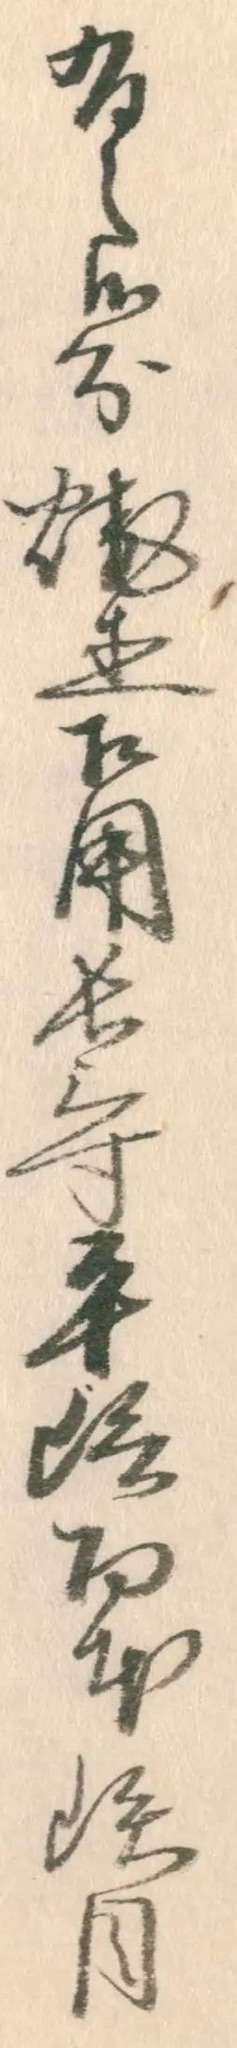有之候分焼直相用長三寸平鋲百本鉄目
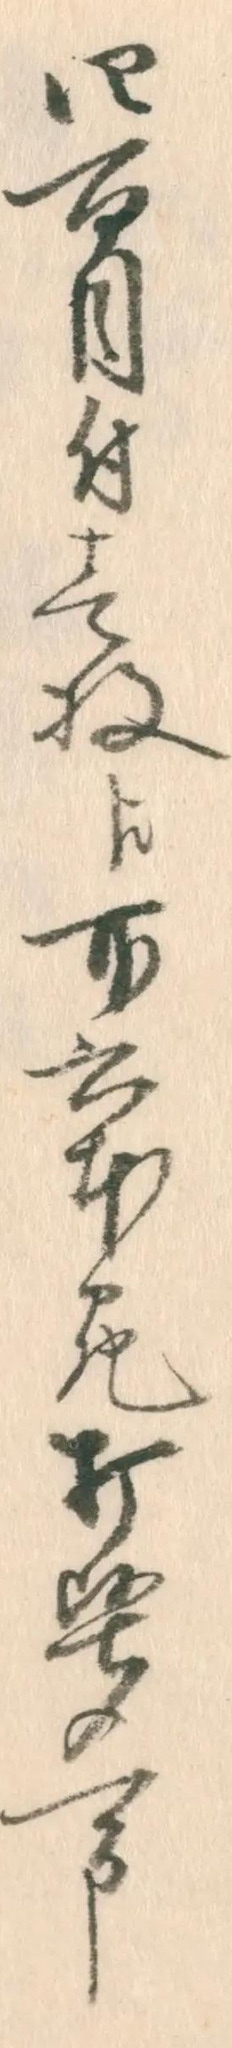四百目付壱枚え廿六本宛打堅メ可申
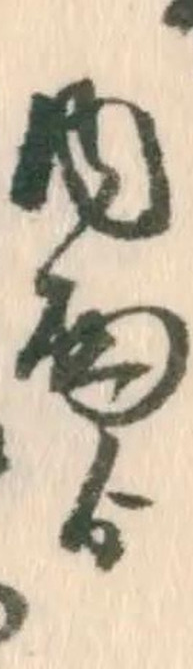内西ゟ
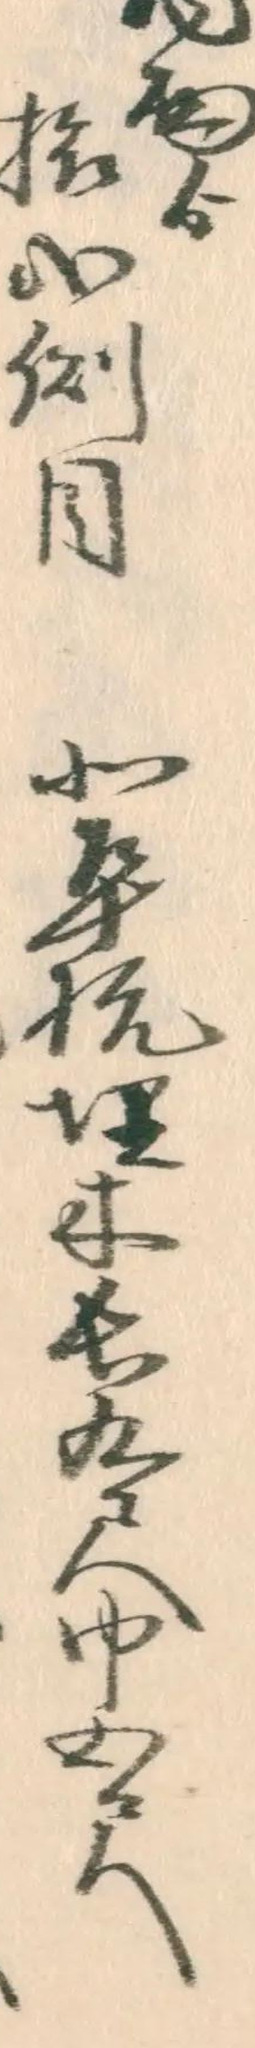拾弐側目北耳杭埋木長九尺巾五尺
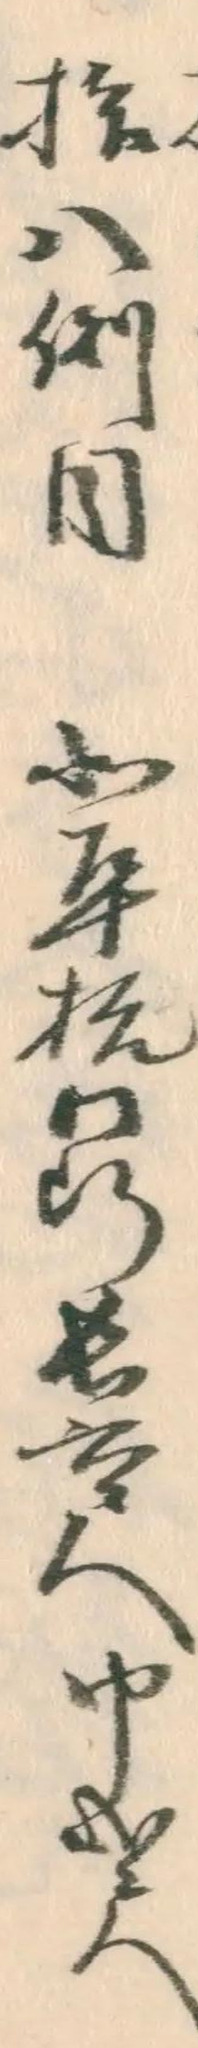拾八側目北耳杭同断長六尺巾弐尺
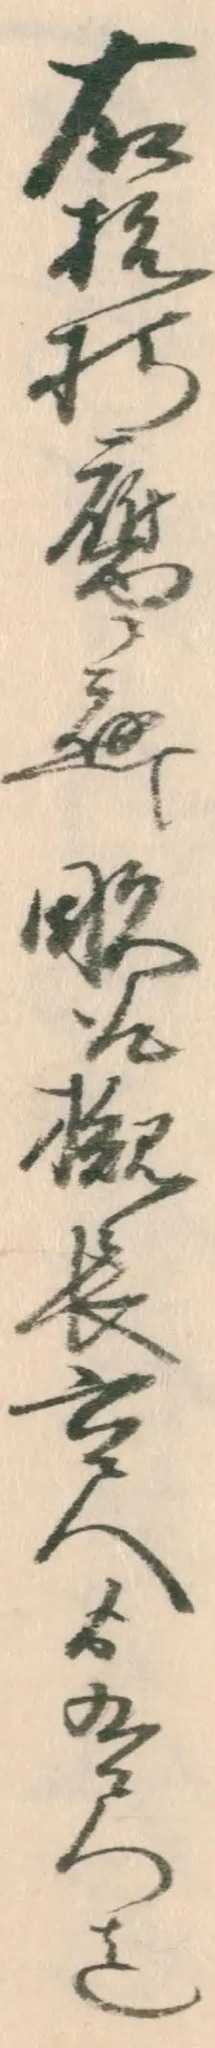右杭朽腐ニ応し彫取槻長六尺ゟ九尺迄
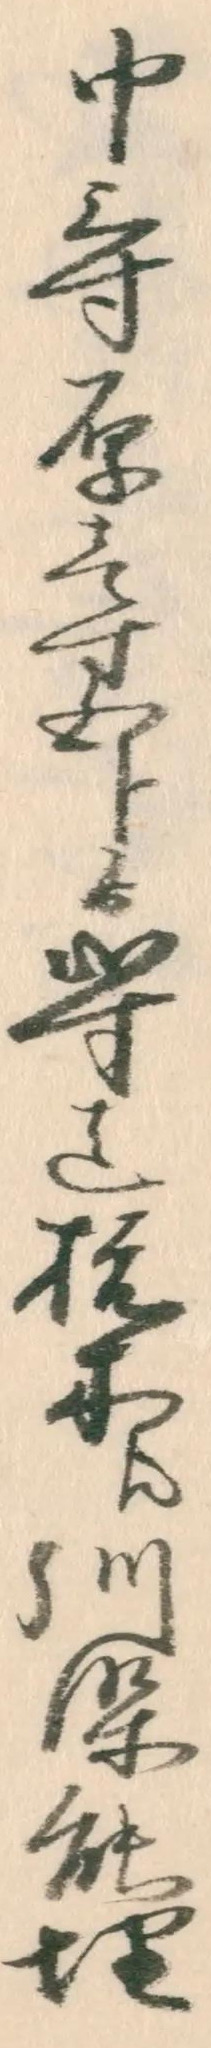巾三寸厚壱寸五分ゟ弐寸迄杭木え馴染能埋
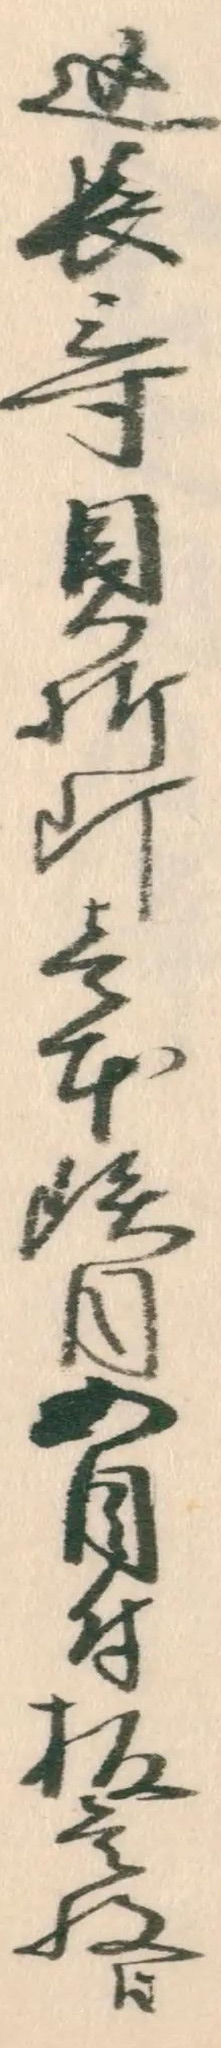込長三寸貝折釘壱本鉄目五目付板壱枚え
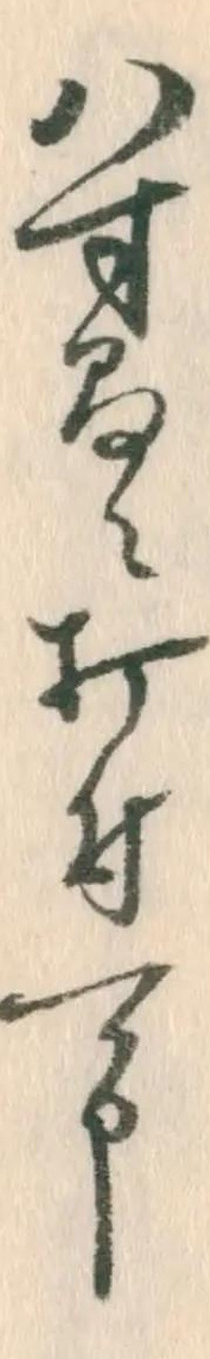八寸間ニ打付可申
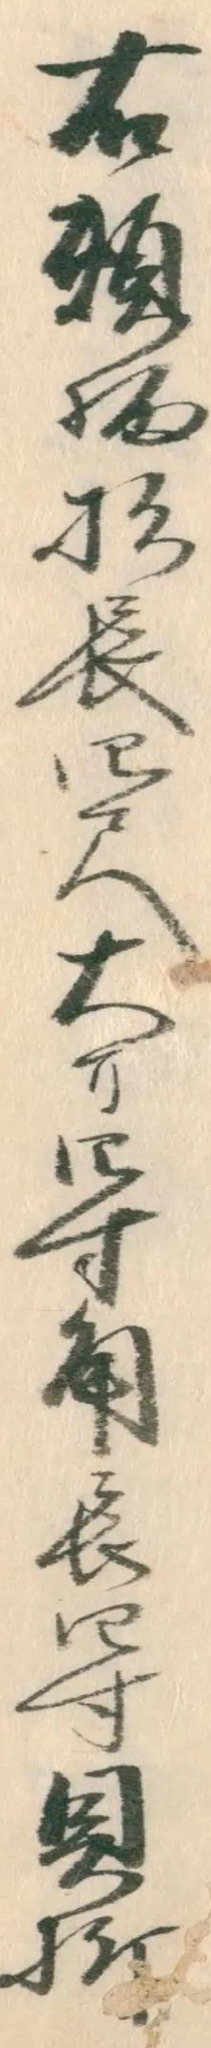右頬柄杉長四尺大サ四寸角長四寸貝折

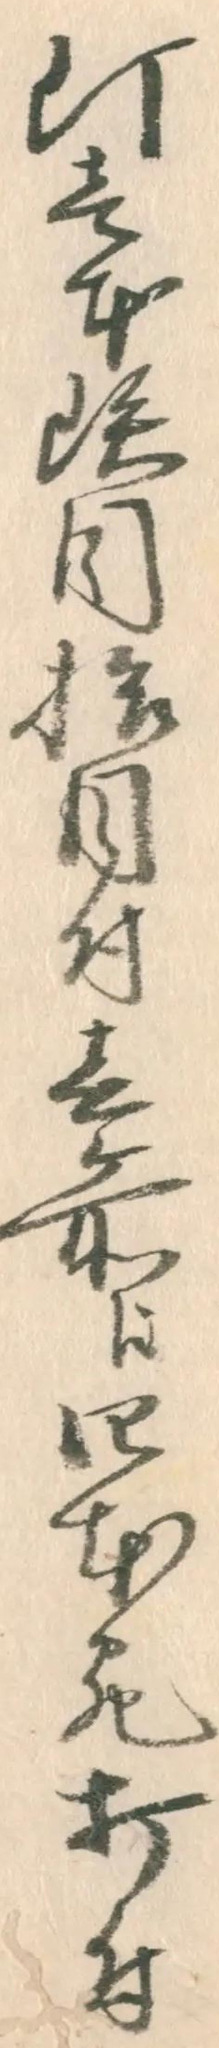釘壱本鉄目拾目付壱ケ所え四本宛打付
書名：三橋 17巻. [7] 三橋小破御修復書留　但御奉行御掛リ替地震潰橋番屋　嘉永四亥年より安政二卯年迄　上
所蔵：国立国会図書館 National Diet Library, JAPAN
